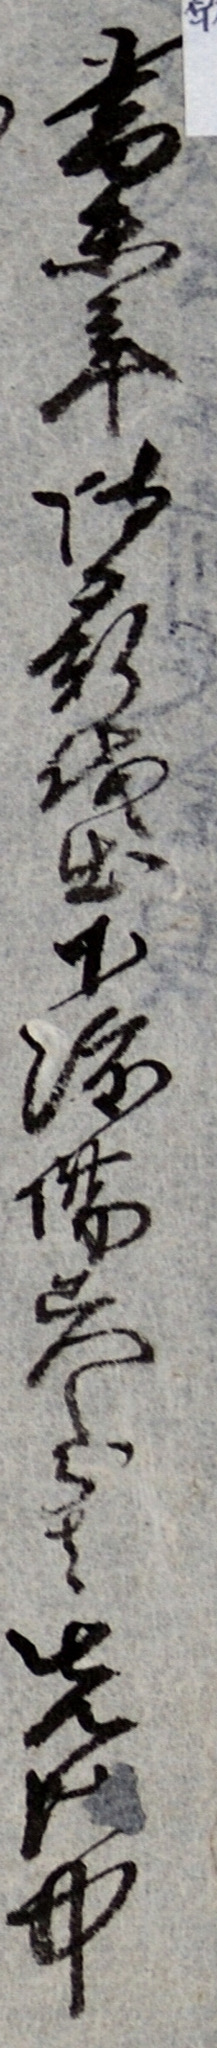当未年御薪伐出下渡場着之分者先頃中
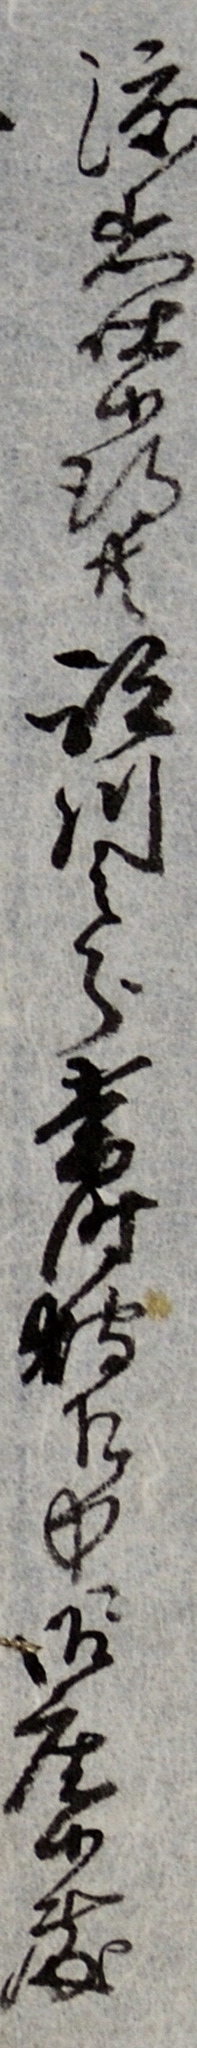渡着仕候得共跡川之分当時狩下ケ中ニ御座候処
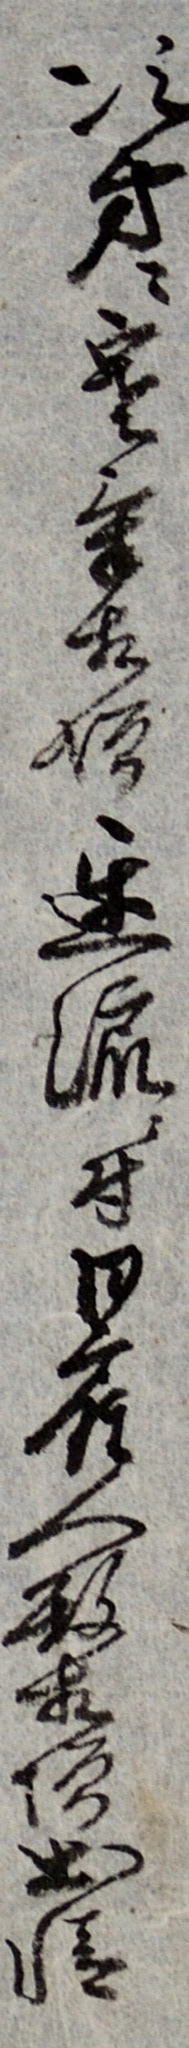次第ニ寒気相増速流ニ付日雇人数相増出情
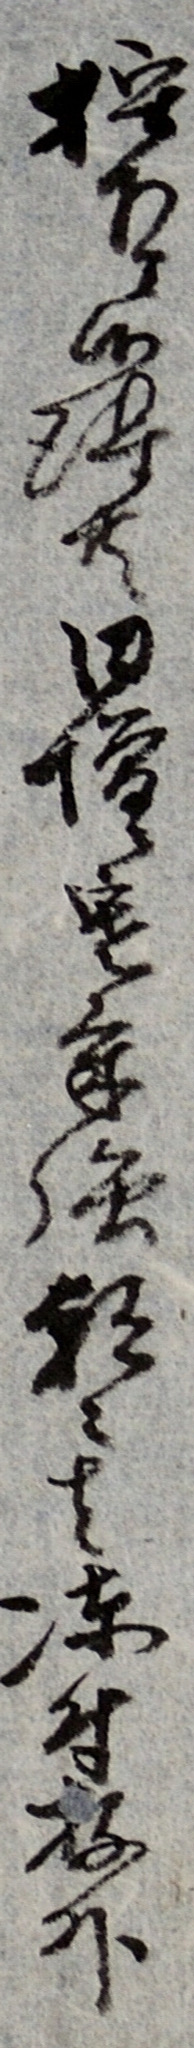狩下ケ候得共日増ニ寒気強朝ニ者凍付存外
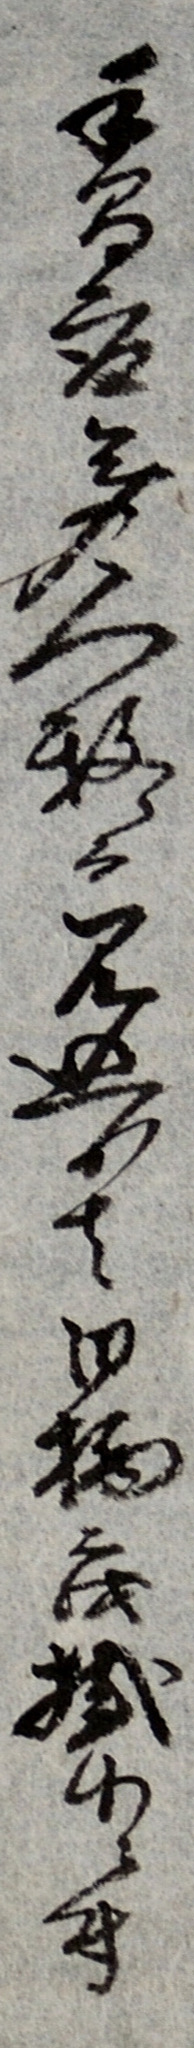手間取多人数ニ而見込ゟ者日柄茂掛候ニ付
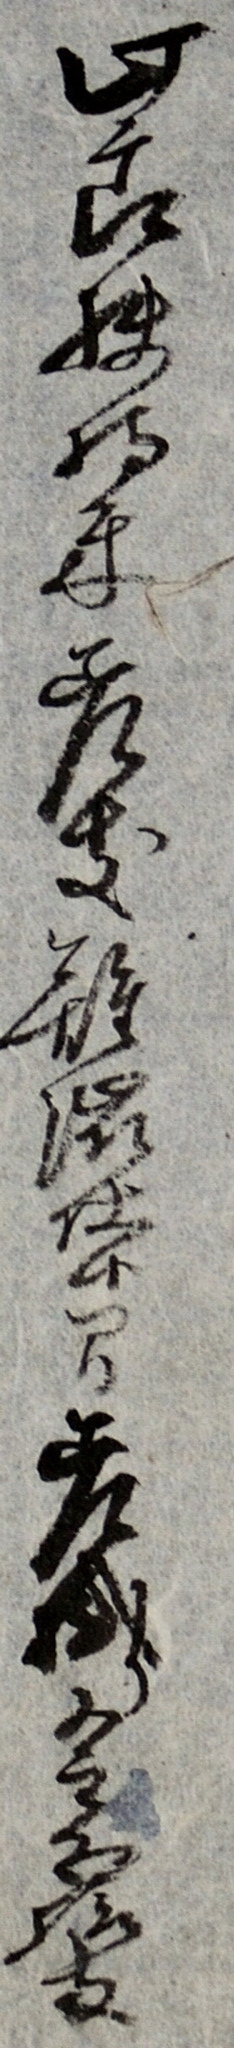此節扶持米差支難渋仕候間差掛り金五拾両
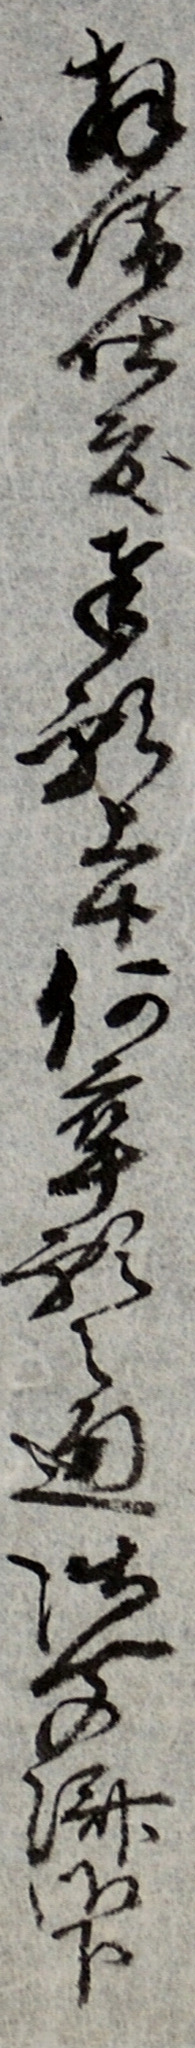拝借仕度奉願上候何卒願之通御聞済御下
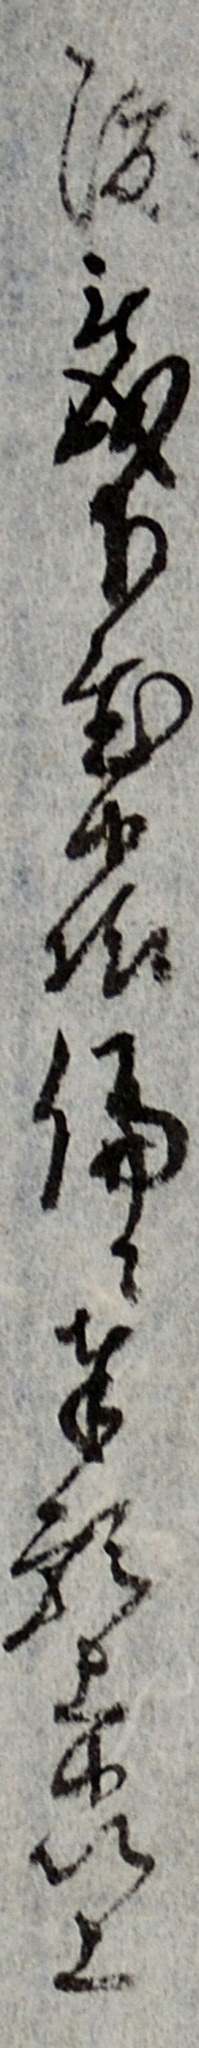渡被成下置候様偏ニ奉願上候以上
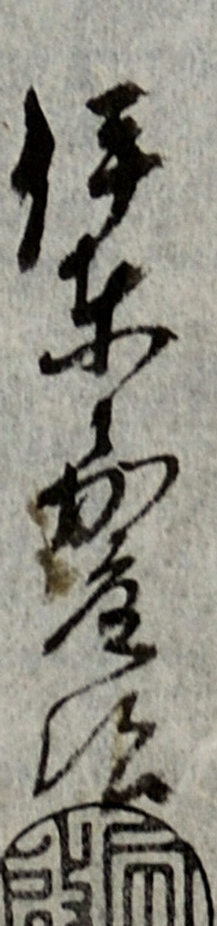伊東嘉藤治㊞
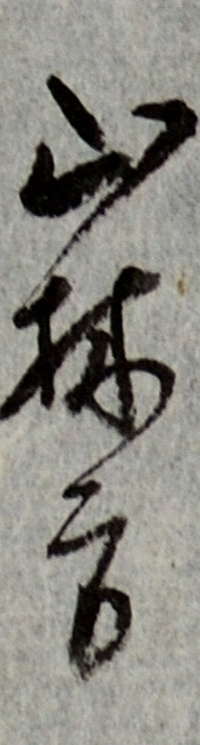山林方
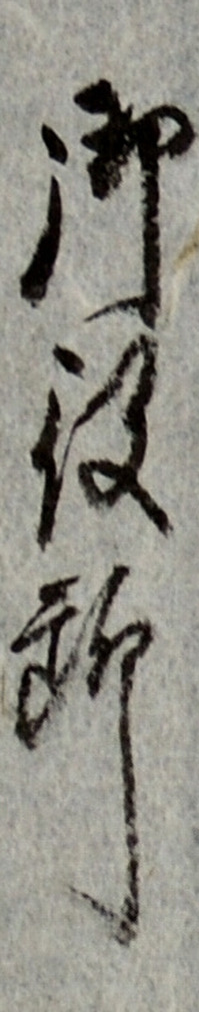御役所

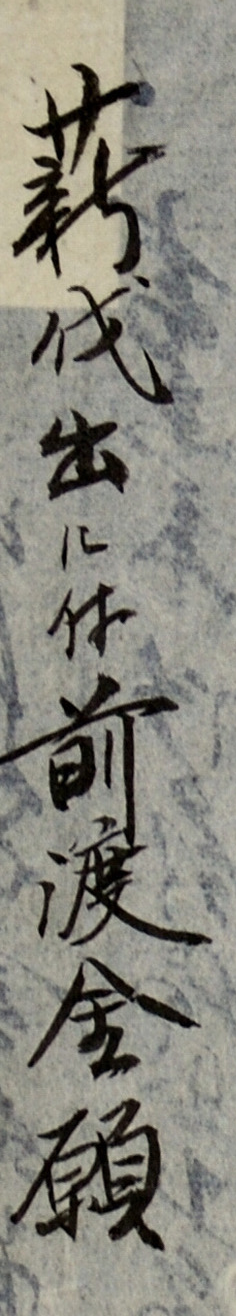薪伐出に付前渡金願
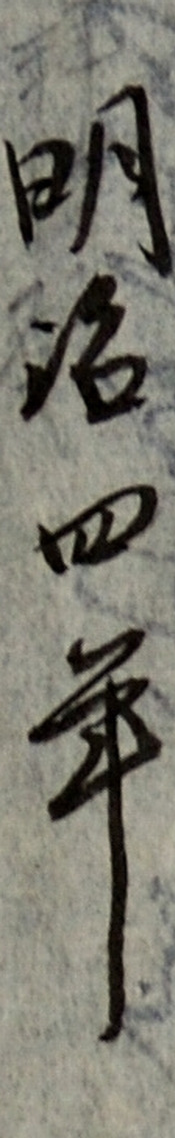明治四年
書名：乍恐以書面奉願上候
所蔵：伊那市立高遠町図書館・合同会社AMANE
